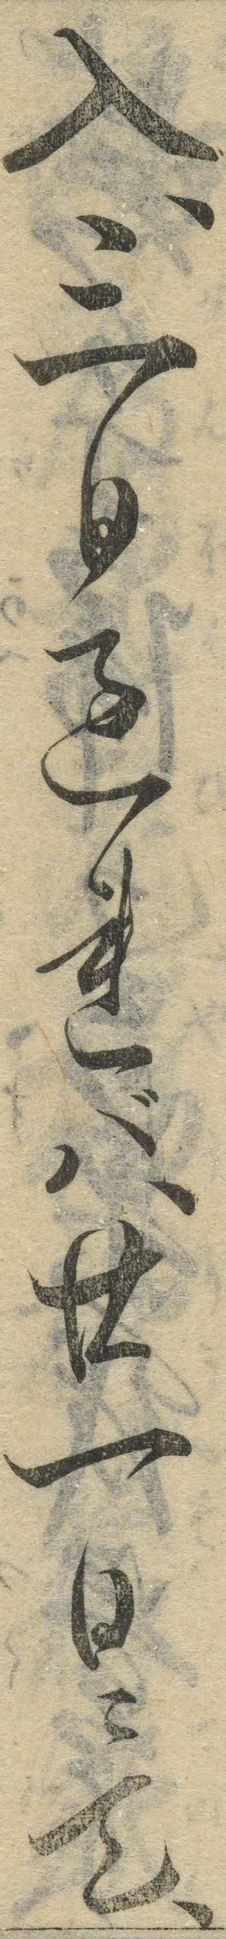入、三日過れば、廿一日にて、
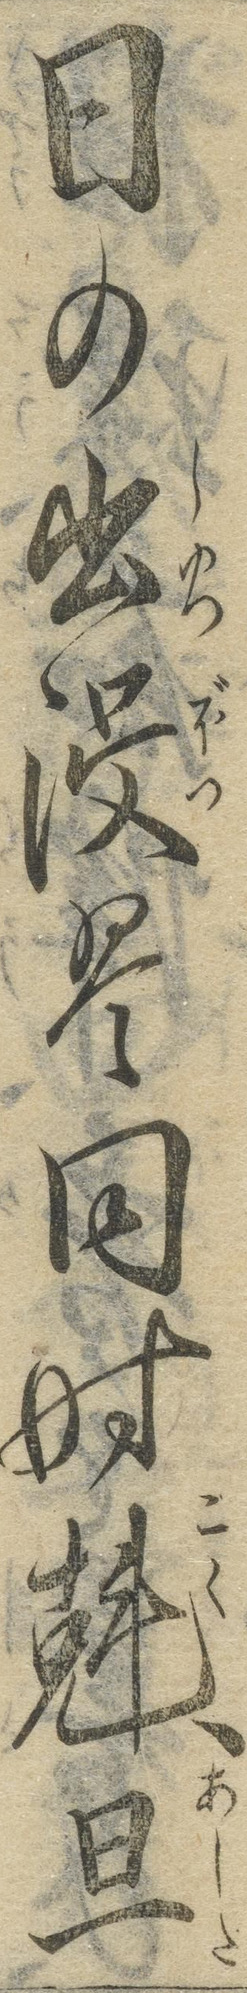日の出没は同時剋、旦
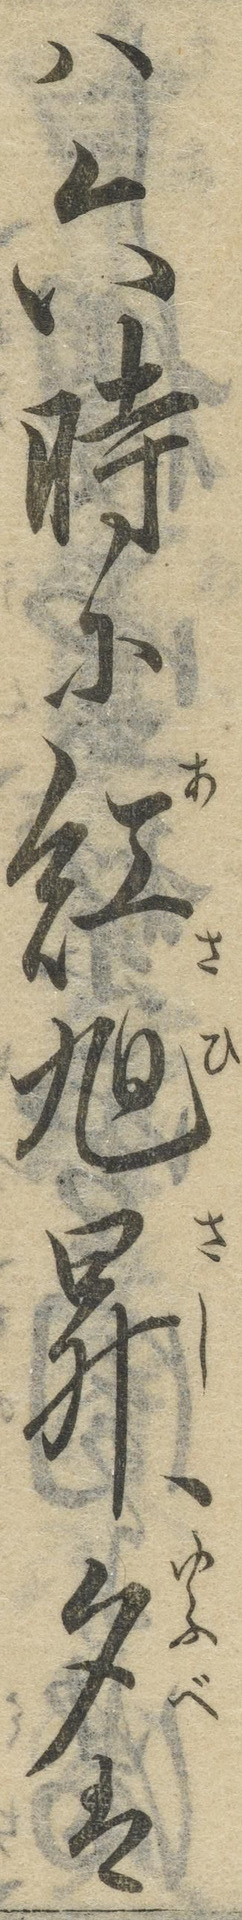は六時に紅旭昇、夕は
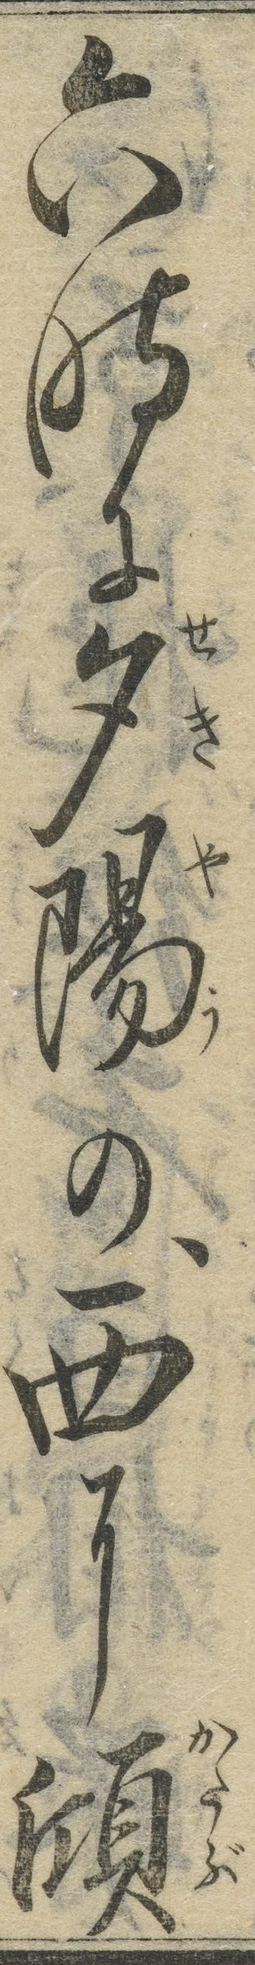六時に夕陽の、西に傾

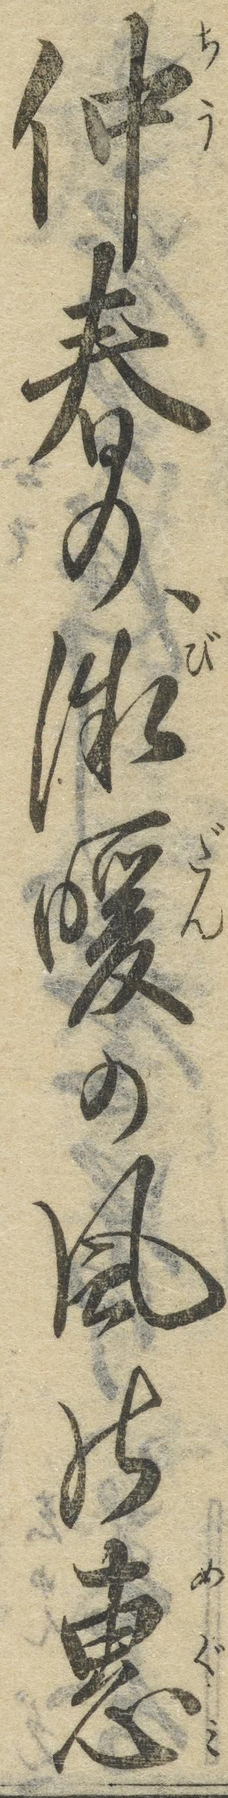仲春の、微暖の風の恵
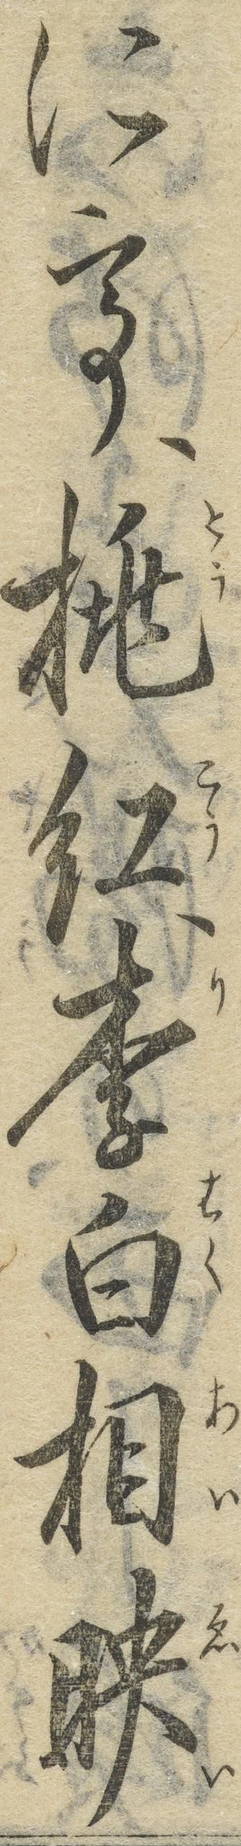にて、桃紅、李白相映
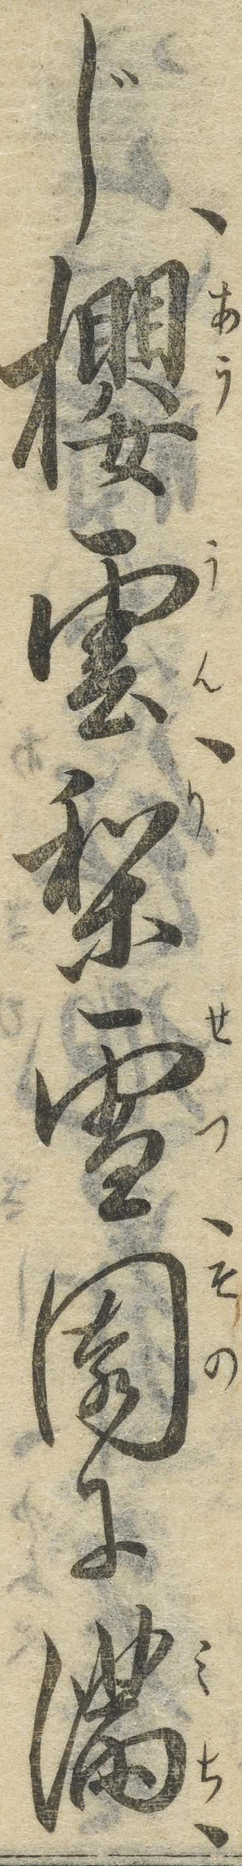じ、桜雲、梨雪、園に満、
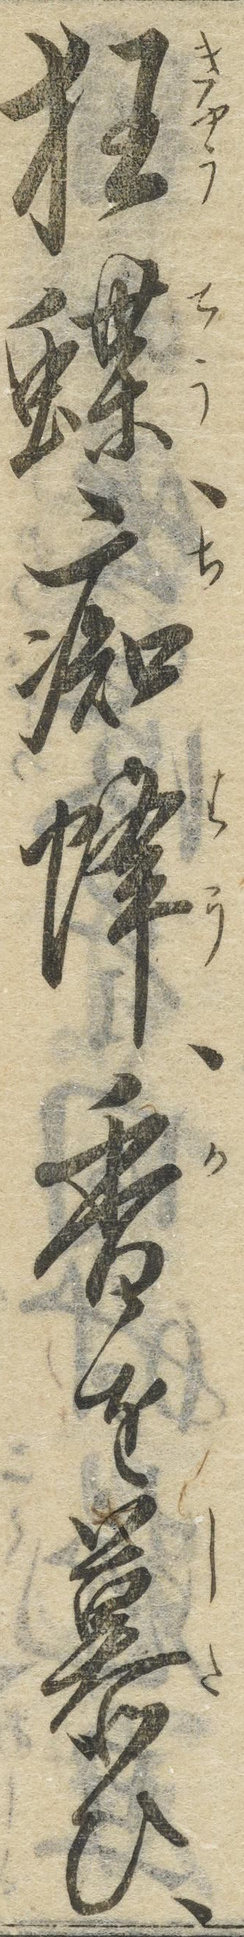狂蝶、痴蜂、香を慕ひ、
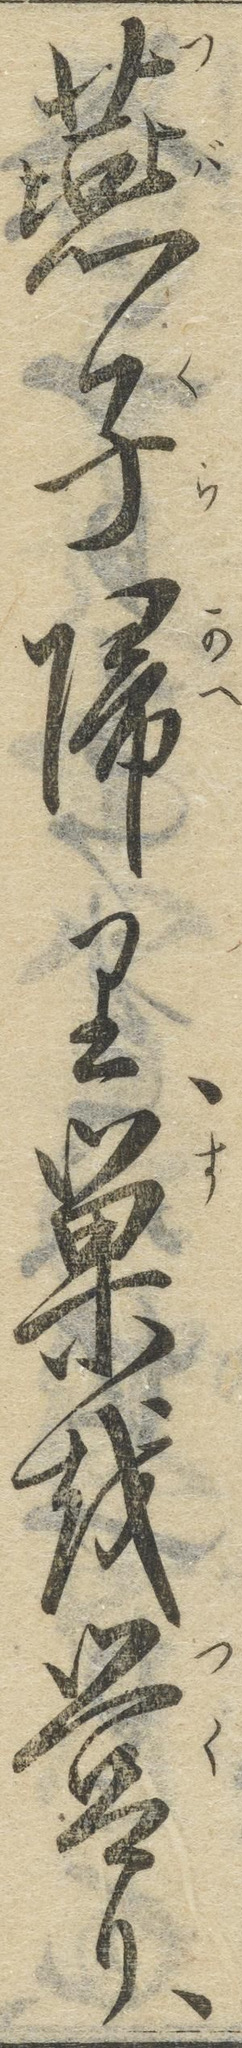燕子帰り、巣を営り、
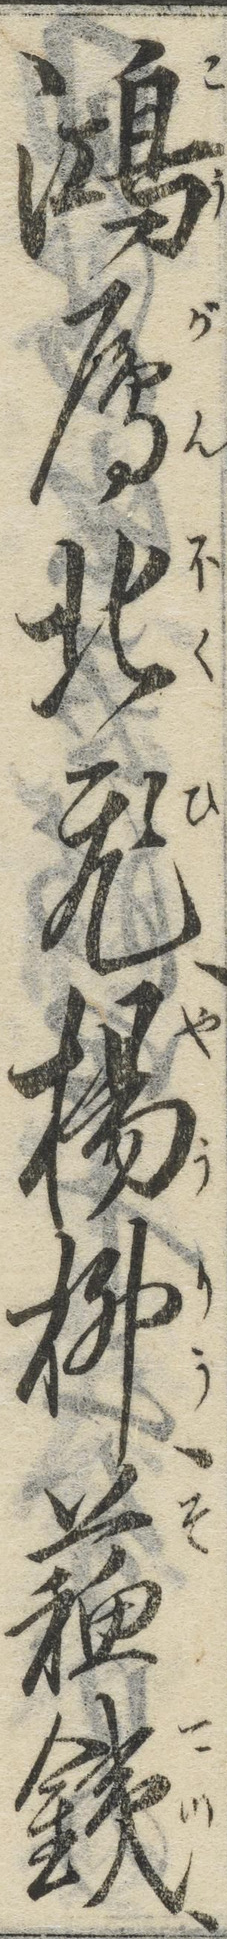鴻雁北飛、楊柳、蘇鉄、
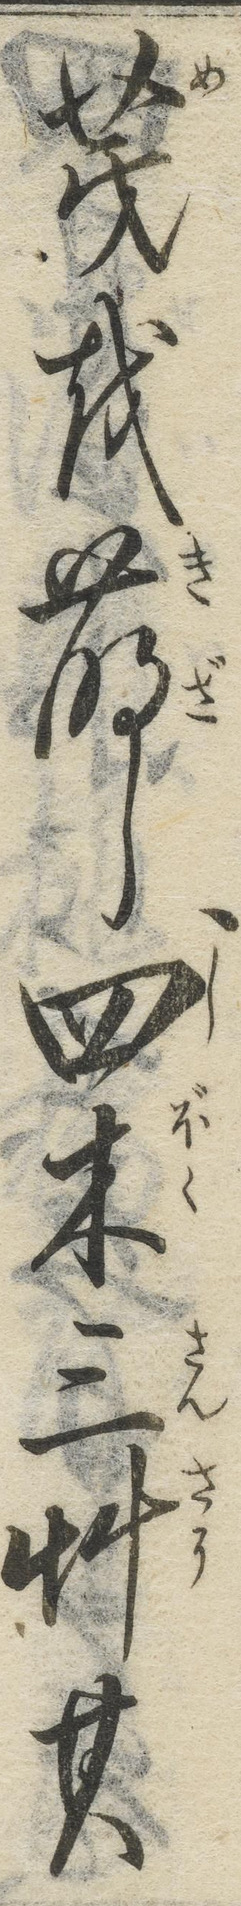芽を萌し、四木三艸其
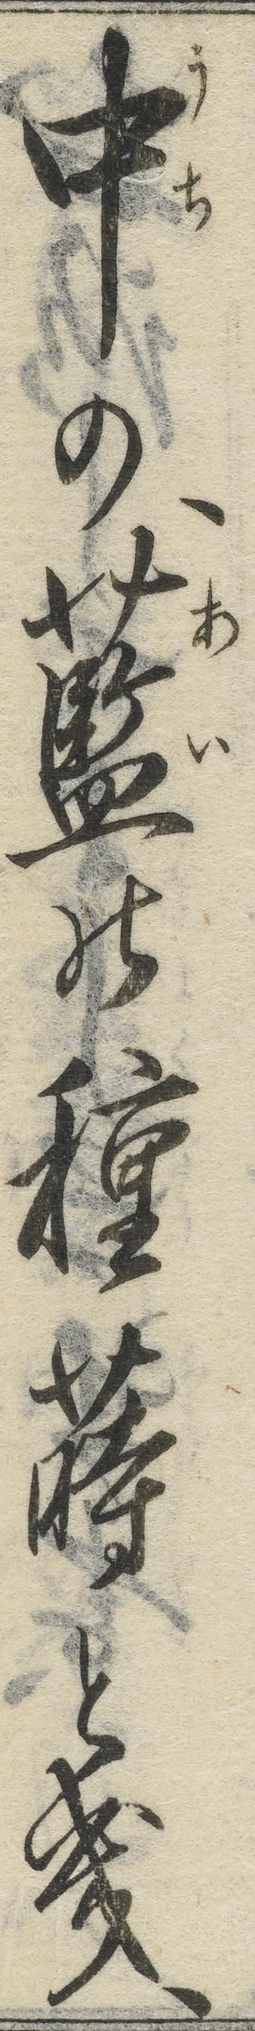中の、藍の種蒔とき、
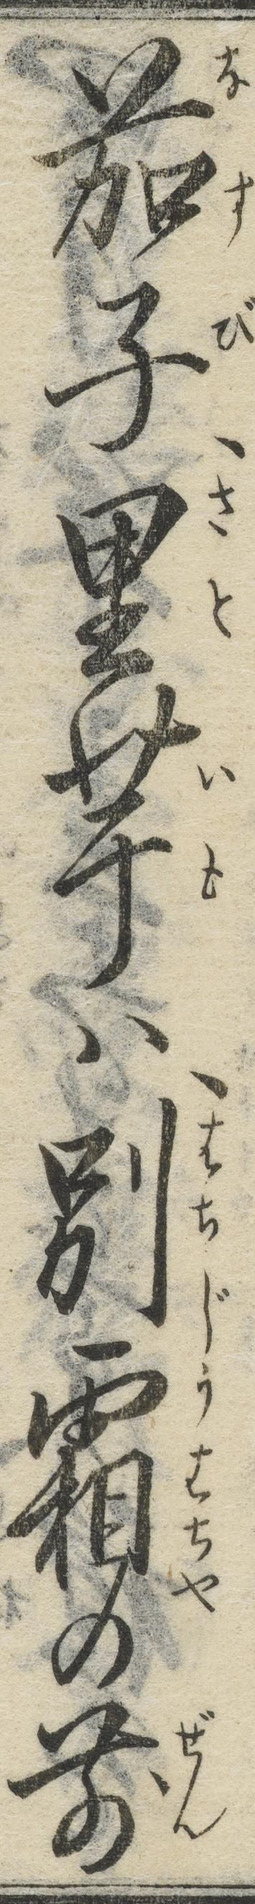茄子、里芋は、別霜の前
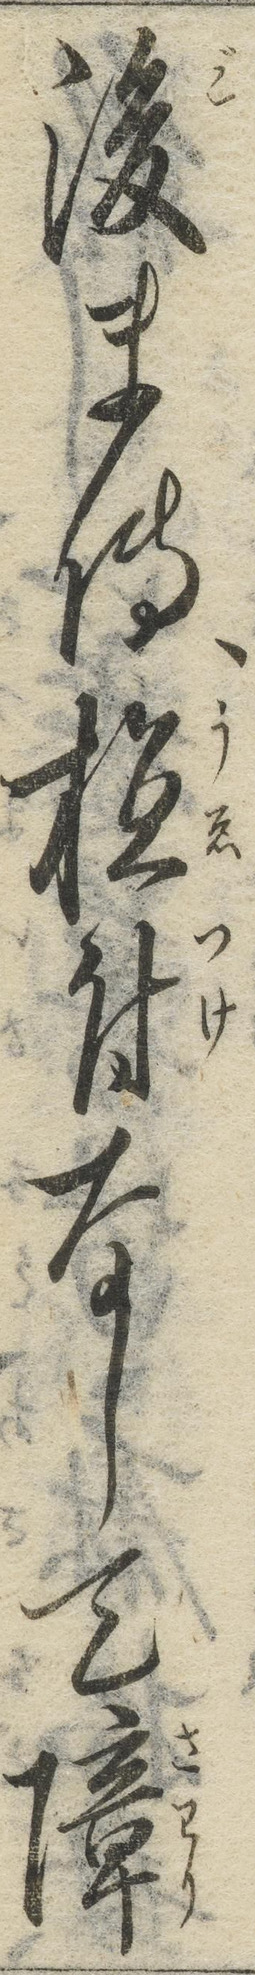後まて、植付なして障

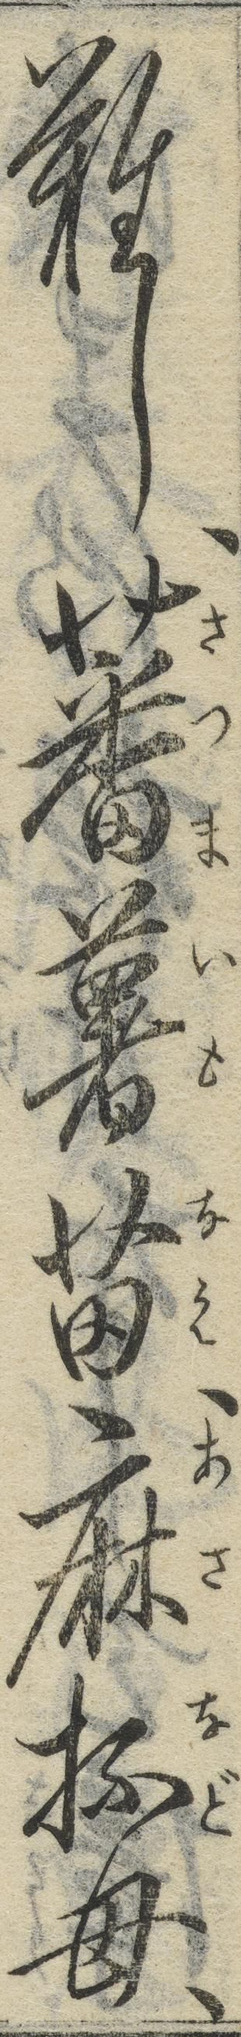なし、蕃薯苗、麻抔も、
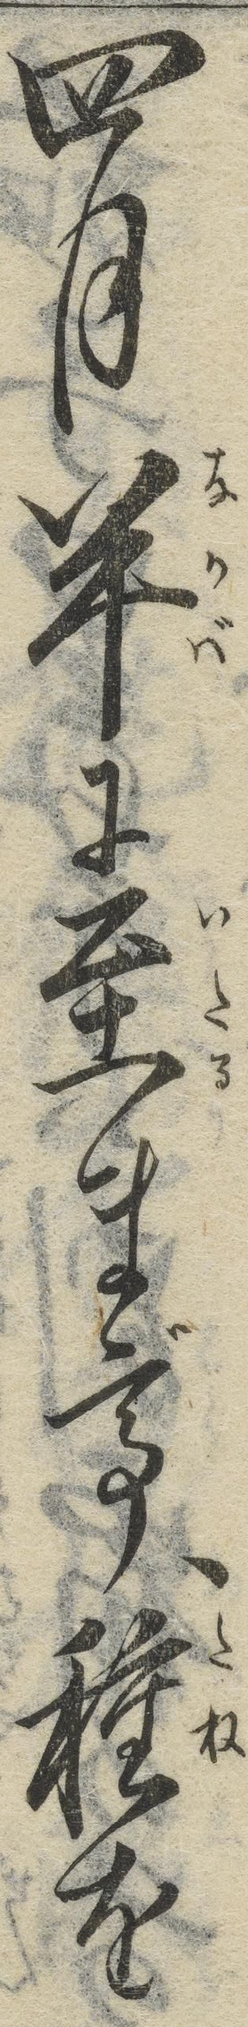四月半に至まで、種を
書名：暦日往来　單
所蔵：東京大学地震研究所図書室 Earthquake Research Institute Library, The University of Tokyo, JAPAN
